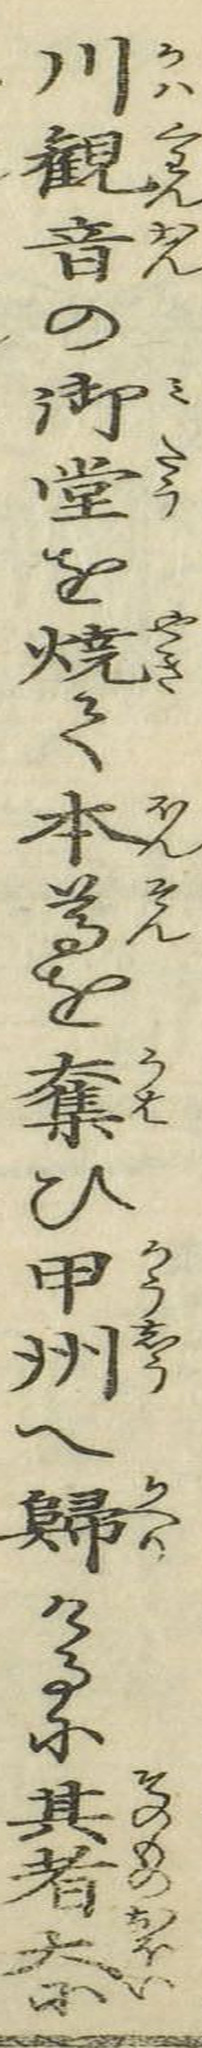川観音の御堂を焼て本尊を奪ひ甲州へ歸けるに其者大に
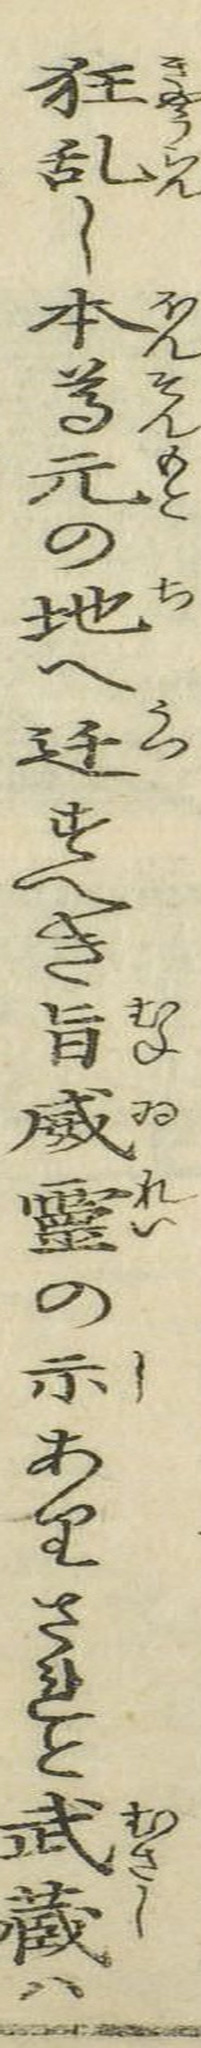狂乱し本尊元の地へ迁すへき旨威靈の示ありされと武藏は
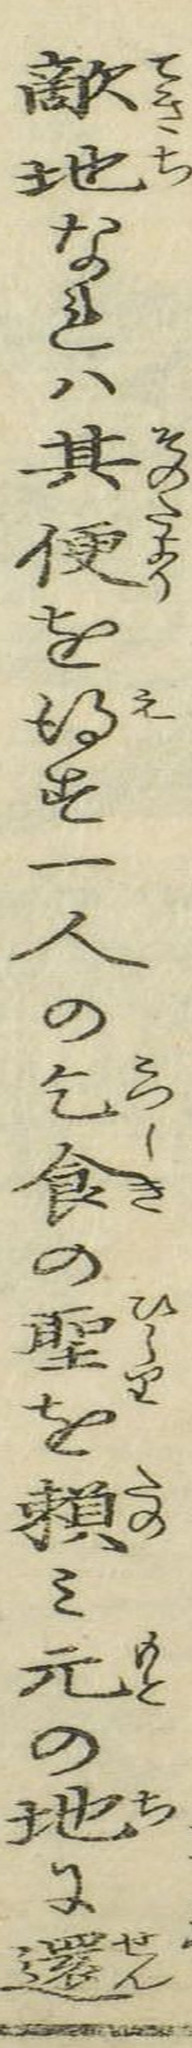敵地なれは其便を得す一人の乞食の聖を頼み元の地に還
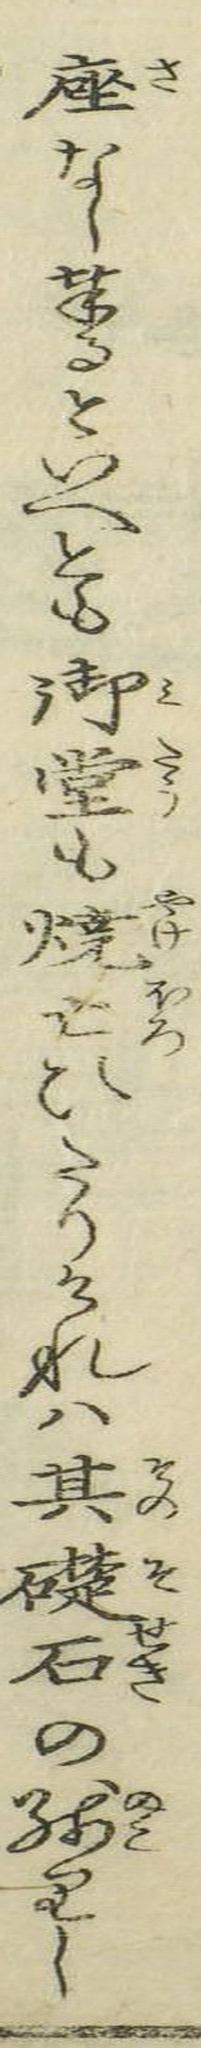𫝶なし奉るといへとも御堂も焼亡ひたりけれは其礎石の残りし
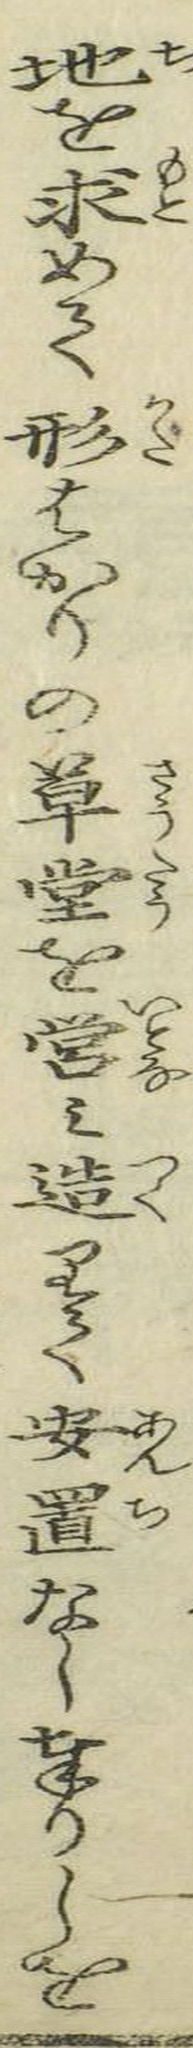地を求めて形はかりの草堂を営み造りて安置なし奉りしを
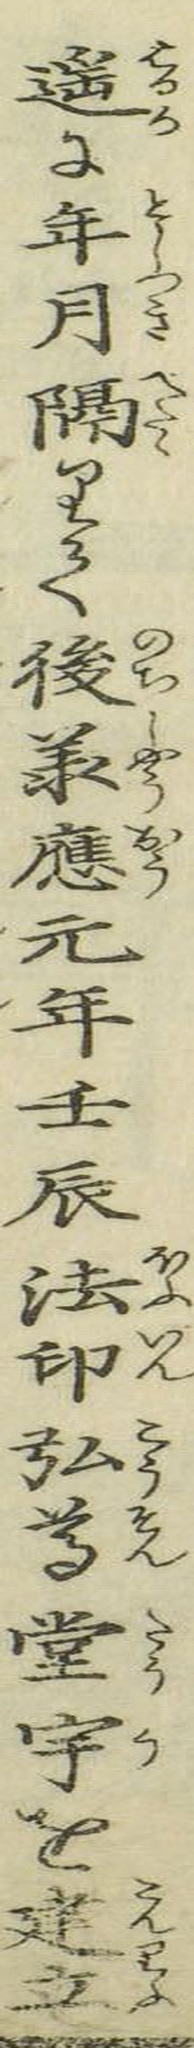遥に年月隔りて後承應元年壬辰法印弘尊堂宇を建立
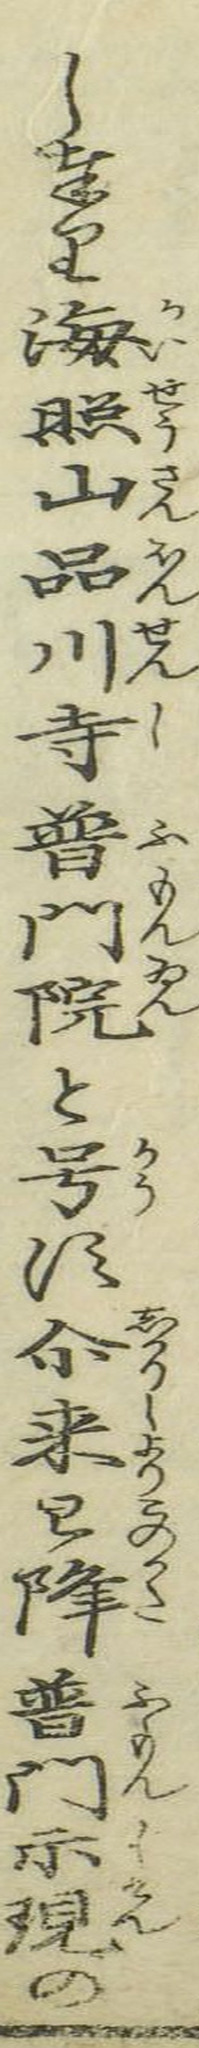し奉り海照山品川寺普門院と号す尒来已降普門示現の

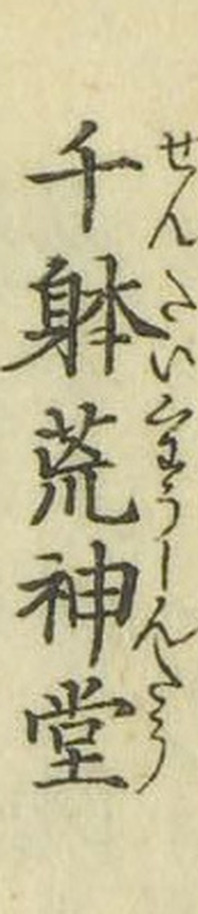千躰荒神堂
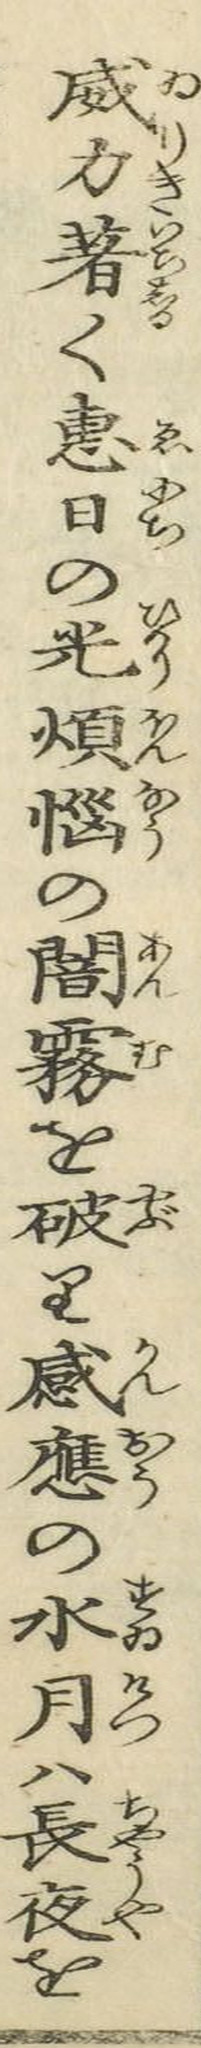威力著く惠日の光煩悩の闇霧を破り感應の水月は長夜を
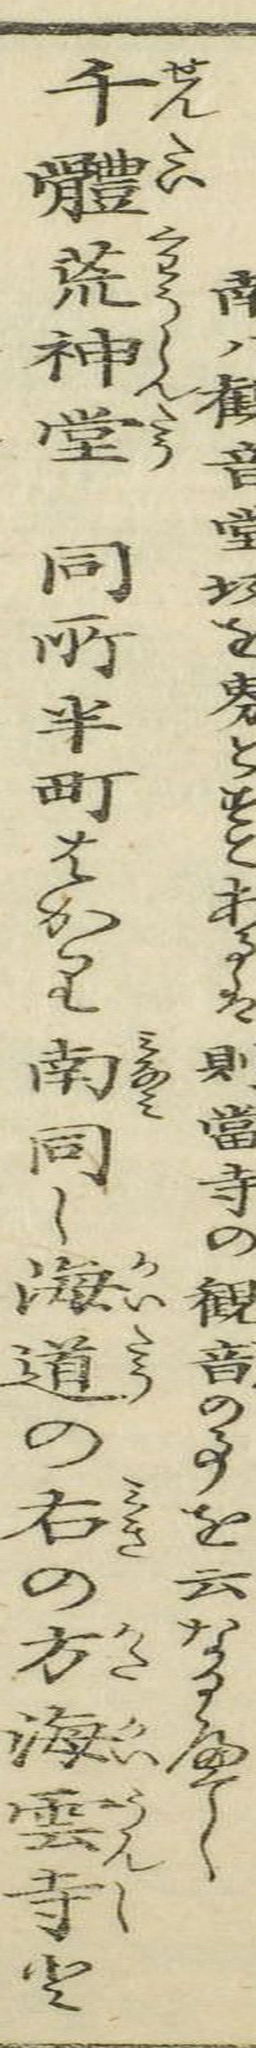千躰荒神堂同所半町はかり南同し海道の右の方海雲寺と
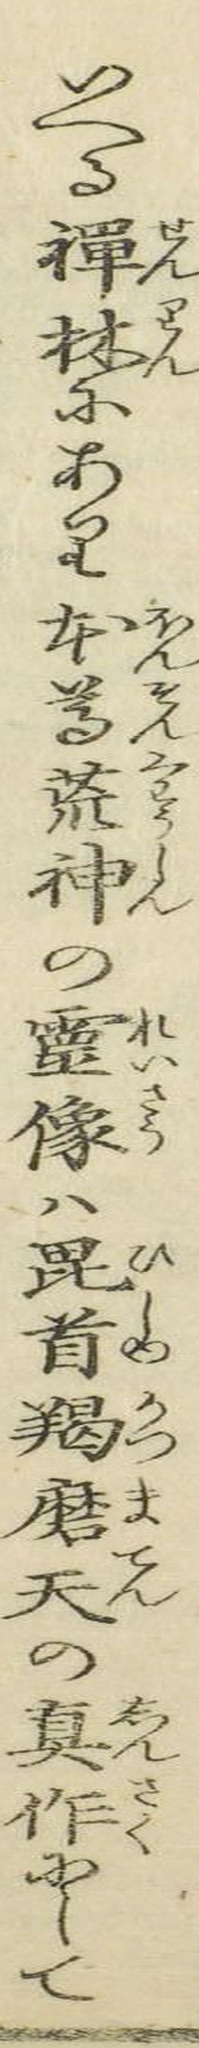いへる禪林にあり本尊荒神の靈像は毘首羯磨天の真作にして
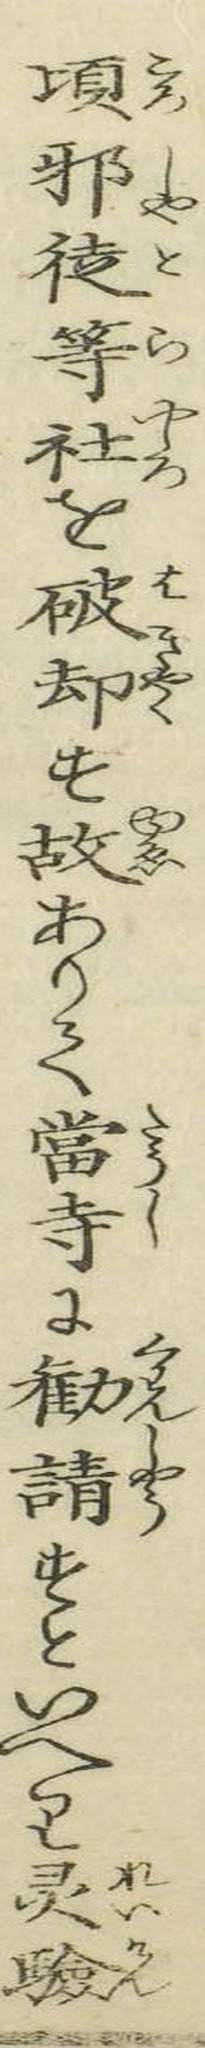頃邪徒等社を破却す故ありて當寺に勧請すといへり灵驗
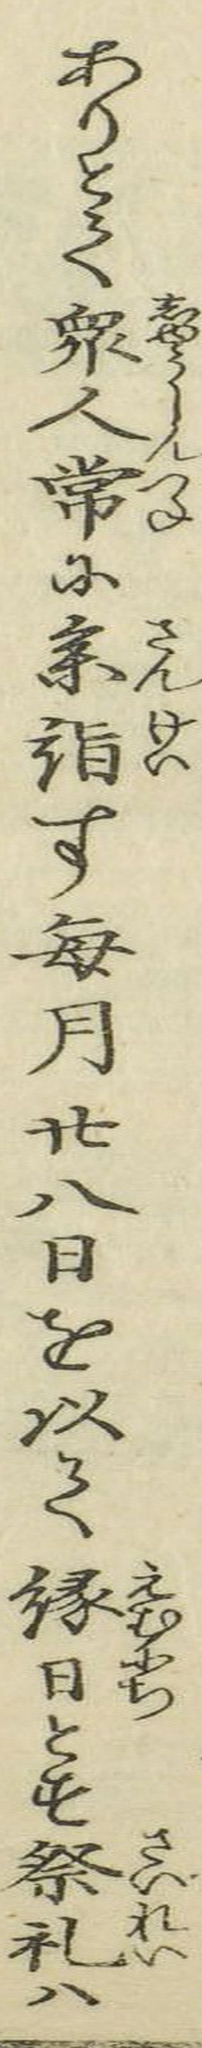ありとて衆人常に参詣す毎月廿八日を以て縁日とす祭礼は
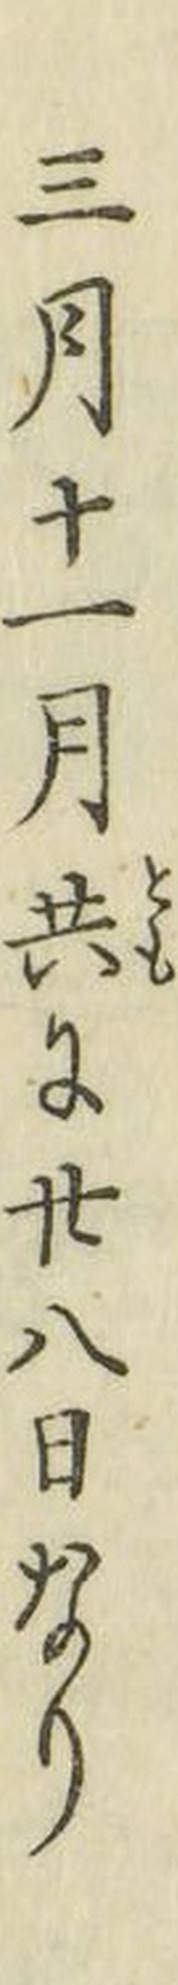三月十一月共に廿八日なり
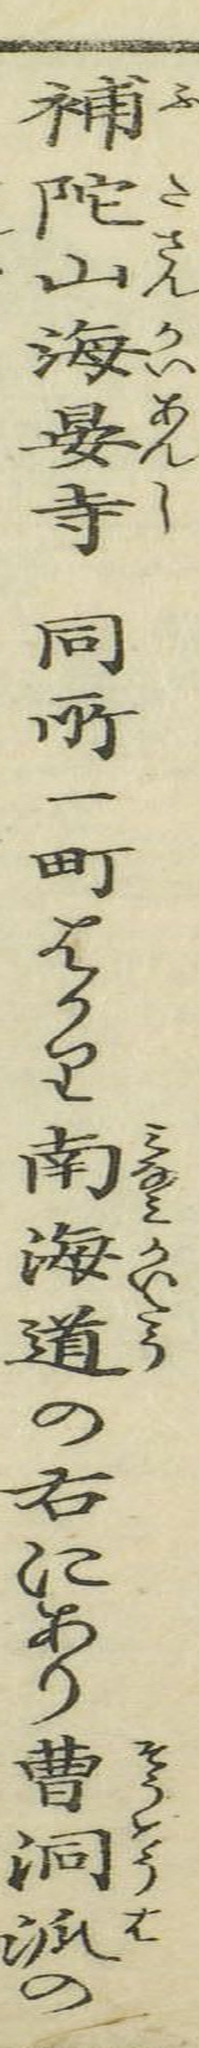補陀山海晏寺同所一町はかり南海道の右にあり曹洞派の
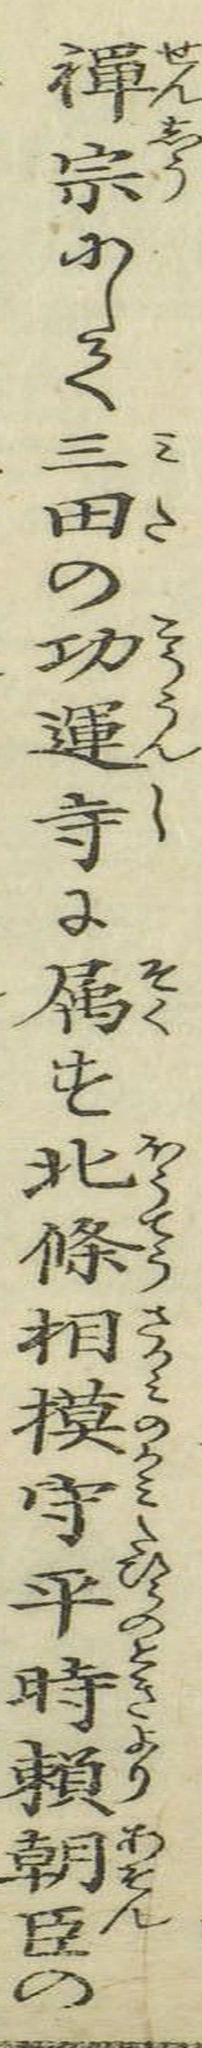禪宗にして三田の功運寺に属す北條相模守平時頼朝臣の
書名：江戸名所図会 20巻 巻之4
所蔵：東京学芸大学教育コンテンツアーカイブ
